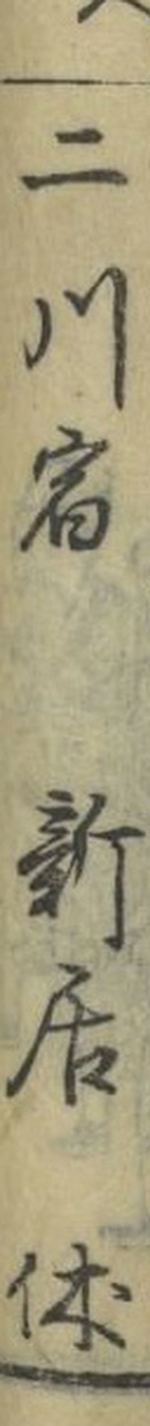二川宿新居休
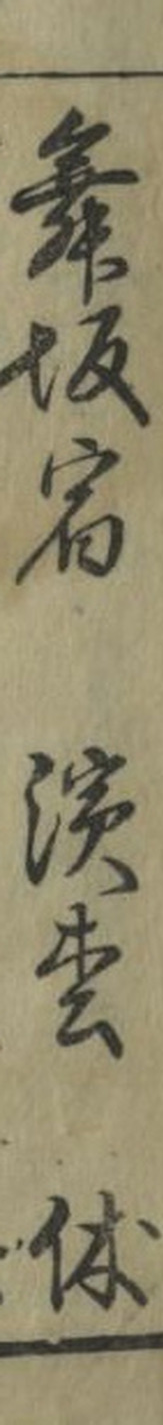舞坂宿濱松休
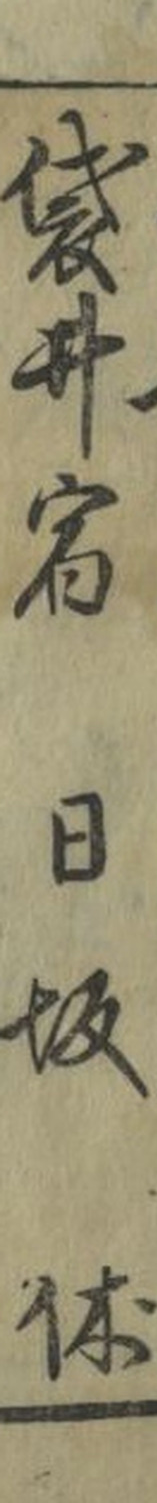袋井宿日坂休
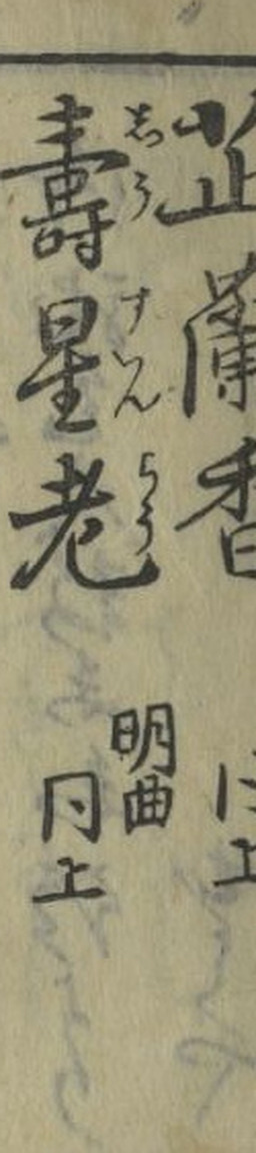壽星老明曲同上
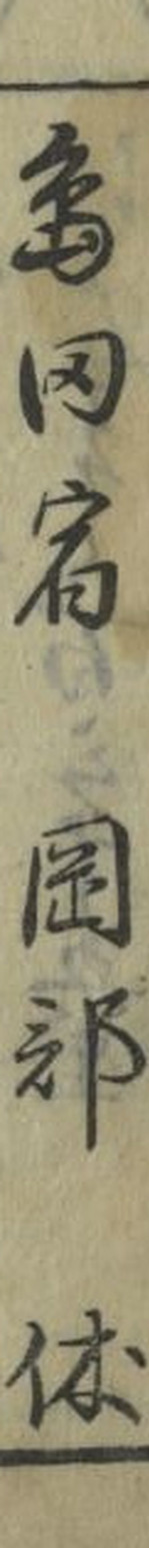島田宿岡部休
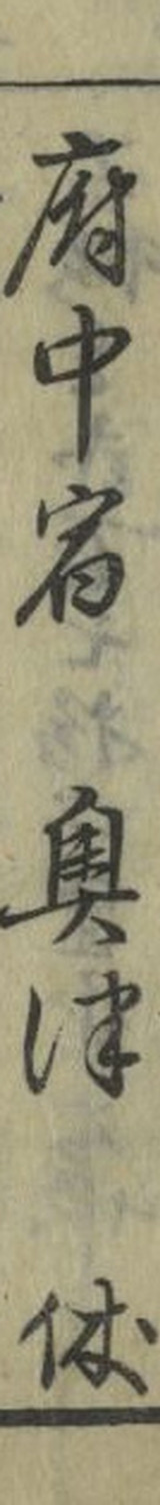府中宿奥津休
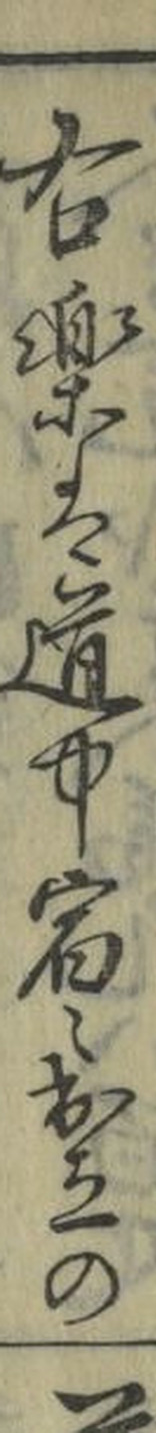右樂は道中宿々出立の
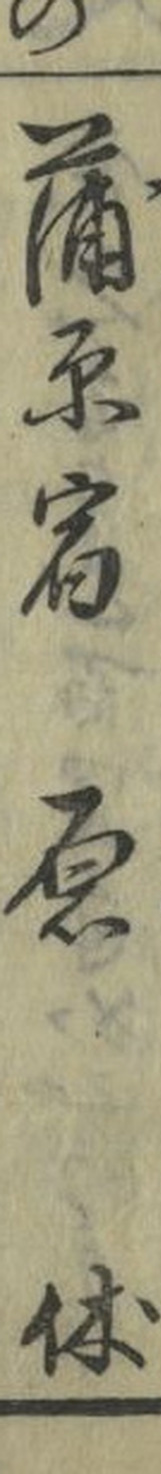蒲原宿原休
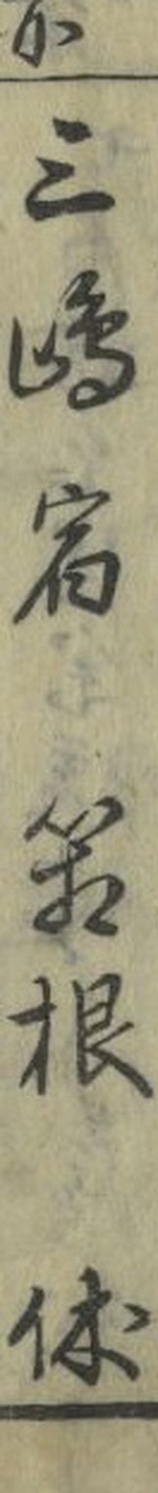三崎宿箱根休
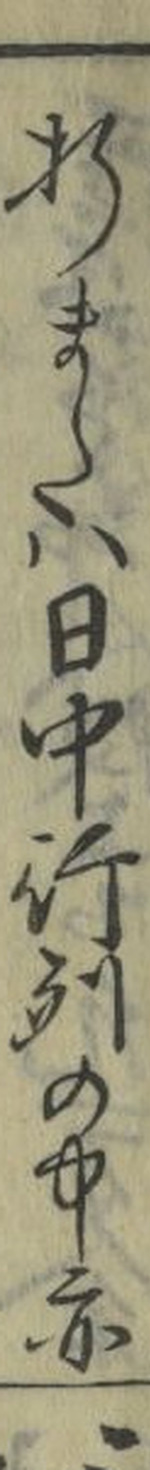折または日中行列の中亦
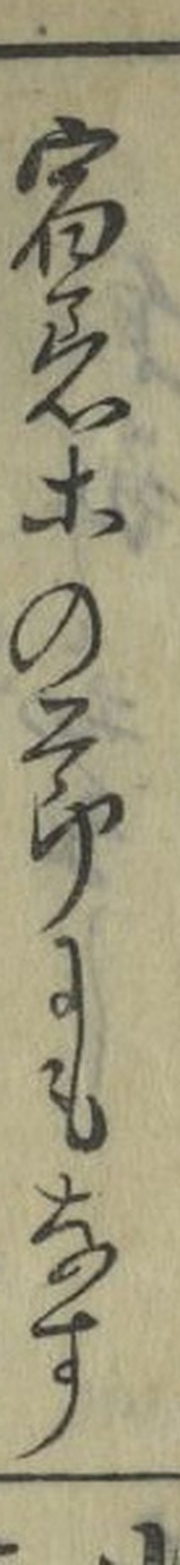宿着等の節にもなす
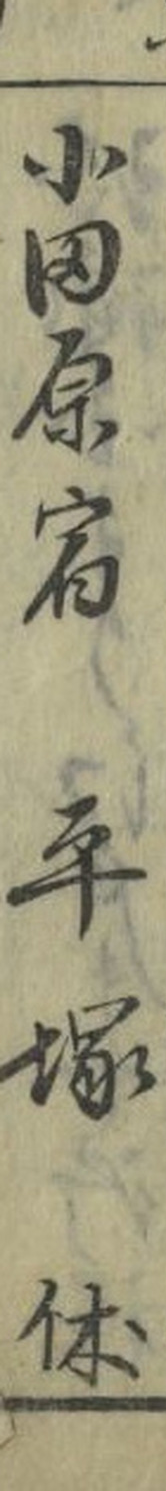小田原宿平塚休
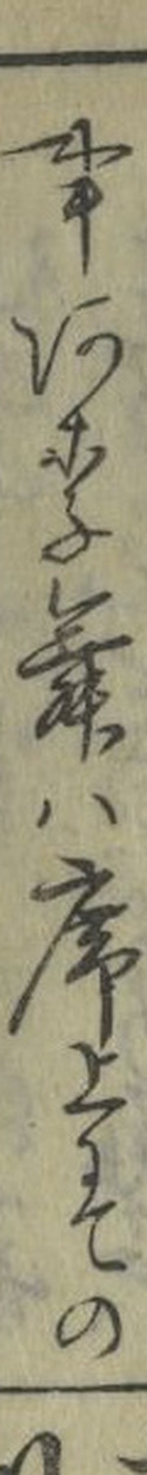事あり舞は席上にての
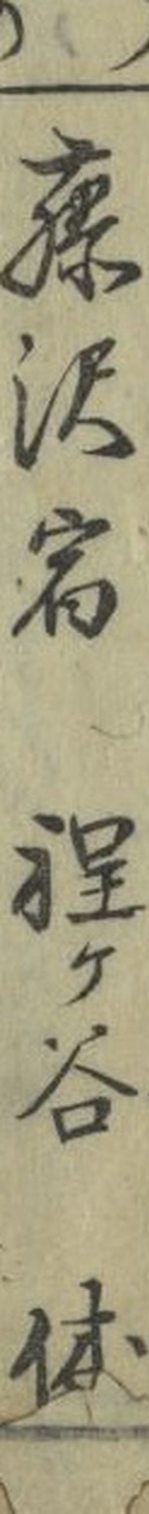藤沢宿程ヶ谷休
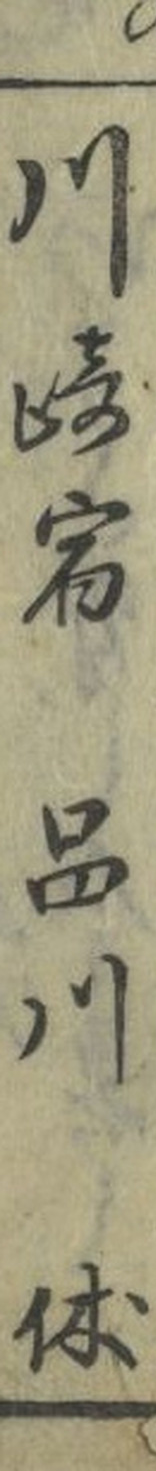川崎宿品川休
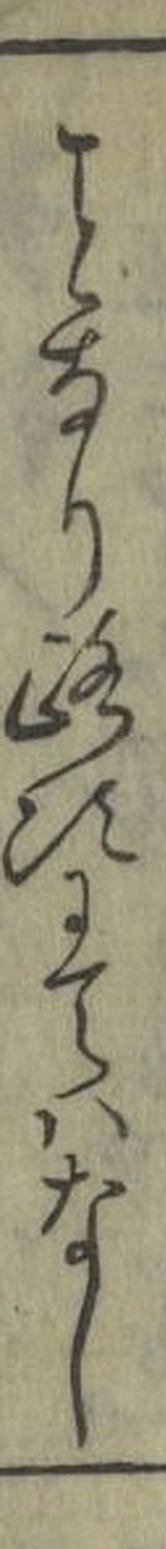ことなり路次にてはなし
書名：[琉球人行列記]
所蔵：University of the Ryukyus Library
